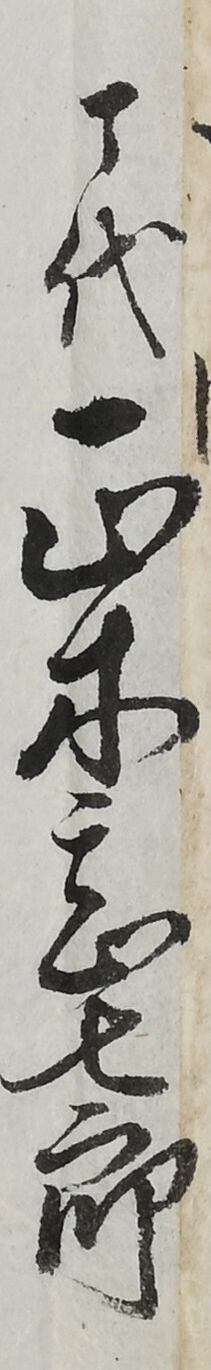丁代正木甚七郎
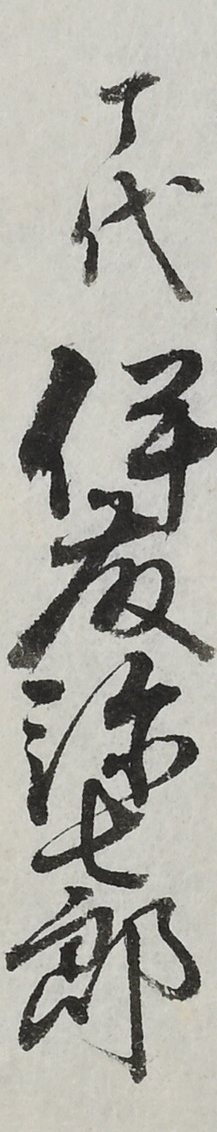丁代伊藤弥七郎
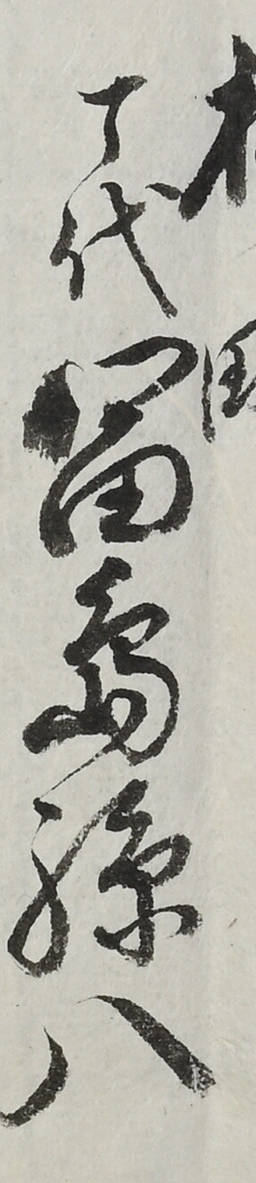丁代冨島孫八
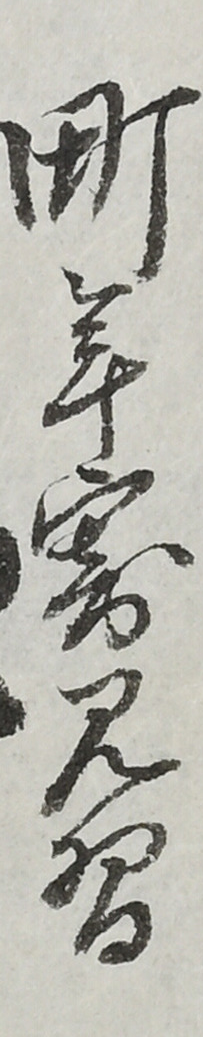町年寄見習
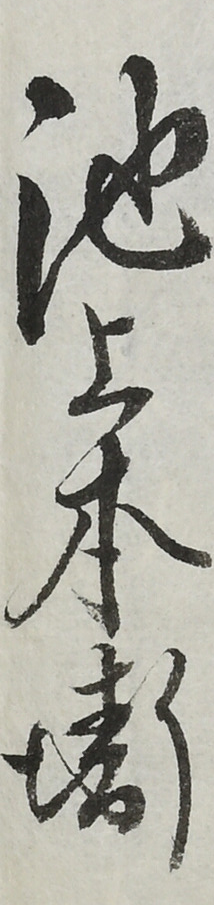池上本衛
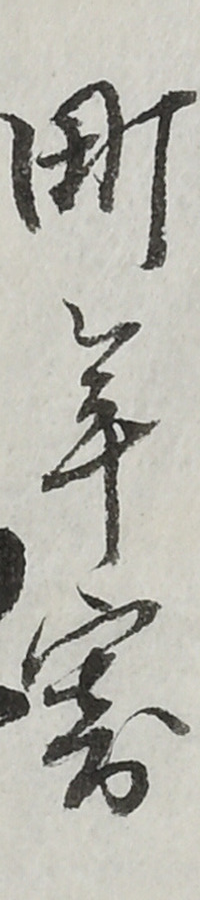町年寄
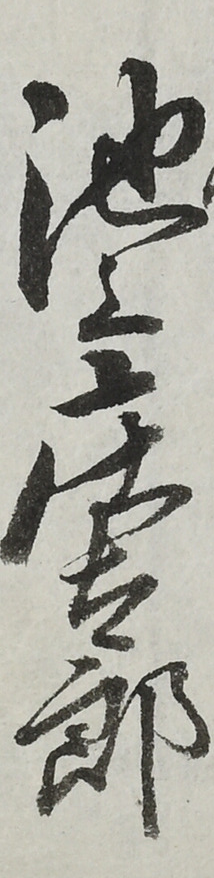池上庄太郎
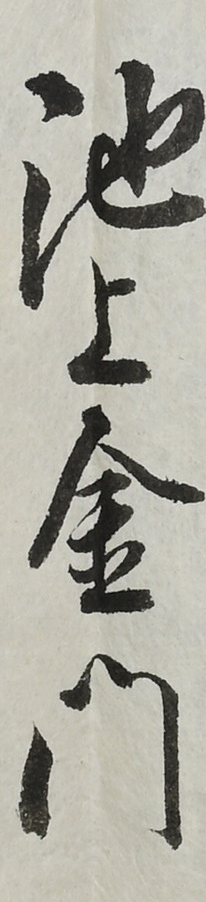池上金門
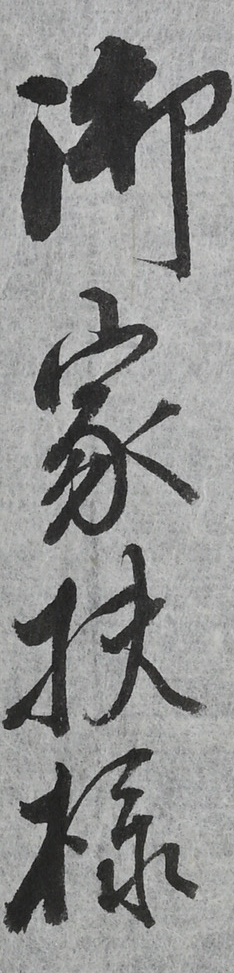御家扶様

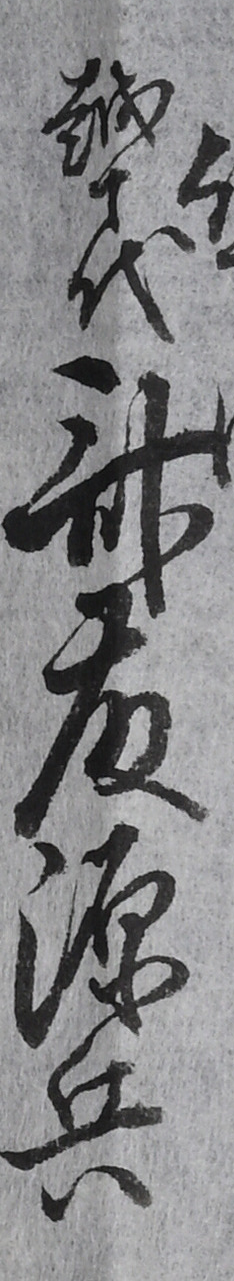越丁代斎藤源兵
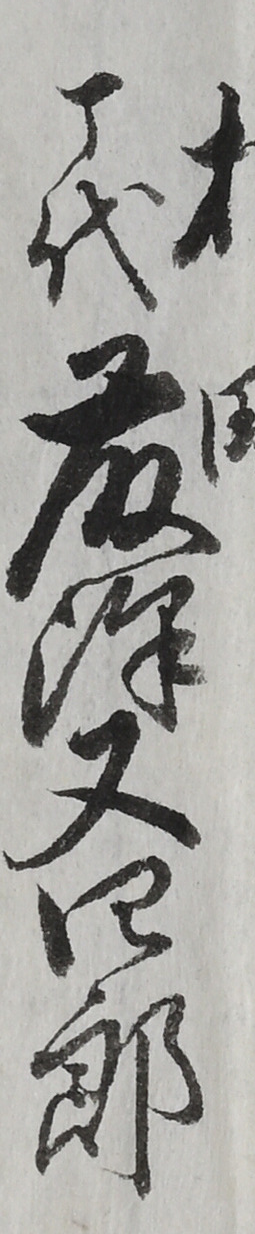丁代藤沢又四郎
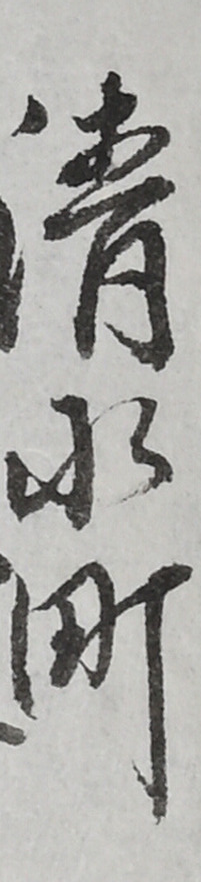清水町
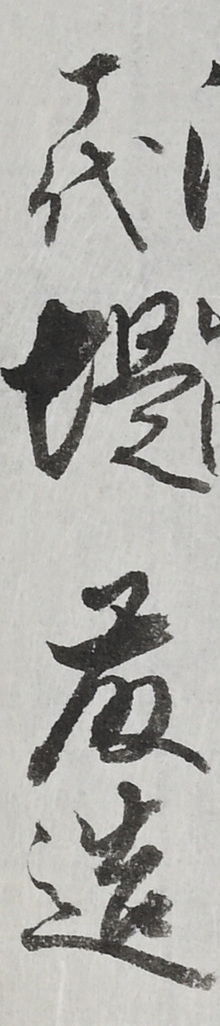丁代堤藤造
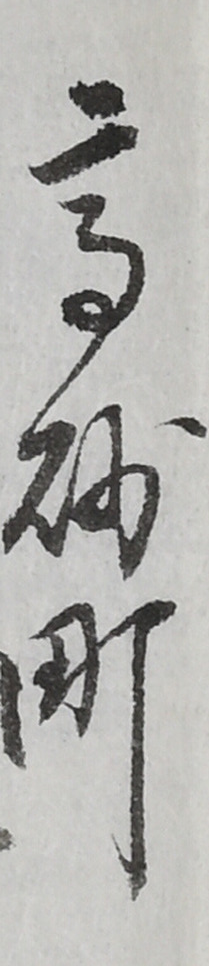高砂町
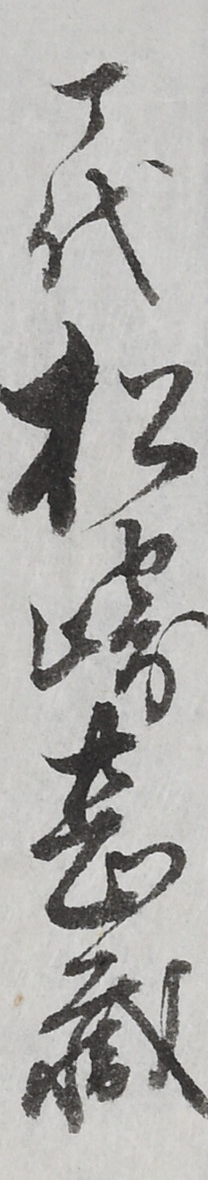丁代松崎甚蔵
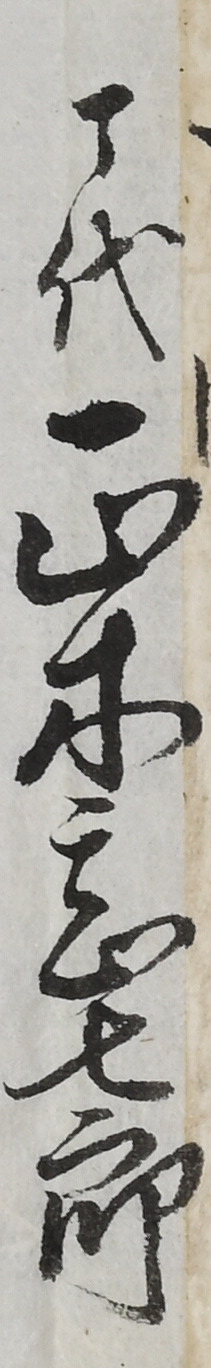丁代正木甚七郎
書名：記
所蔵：伊那市立高遠町図書館・合同会社AMANE
